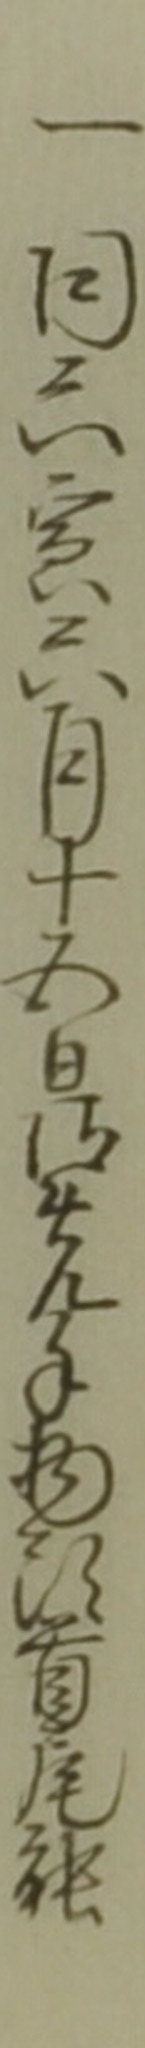一同六寅六月十五日御先手物頭首尾能
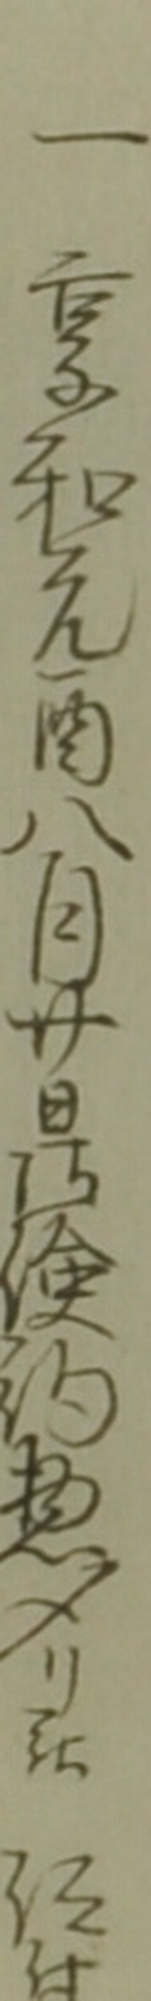一享和元酉八月廿日御倹約惣〆リ被仰付
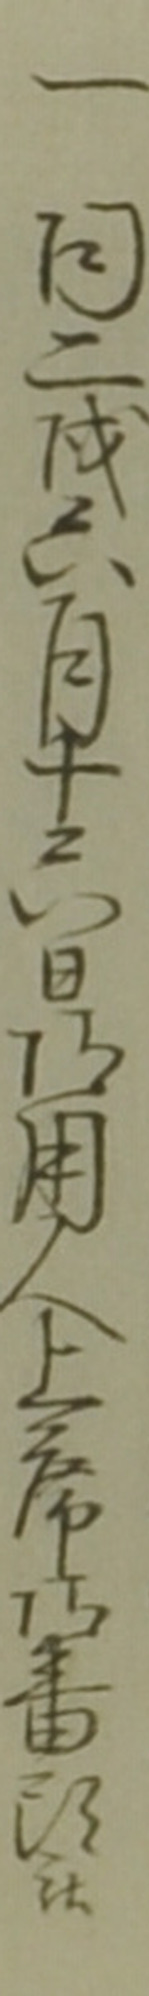一同二戊六月十六日御用人上席御番頭被
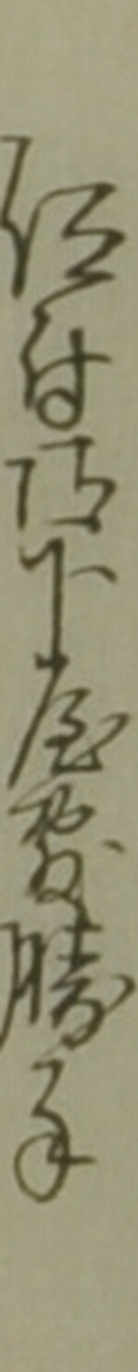仰付御下屋敷勝手
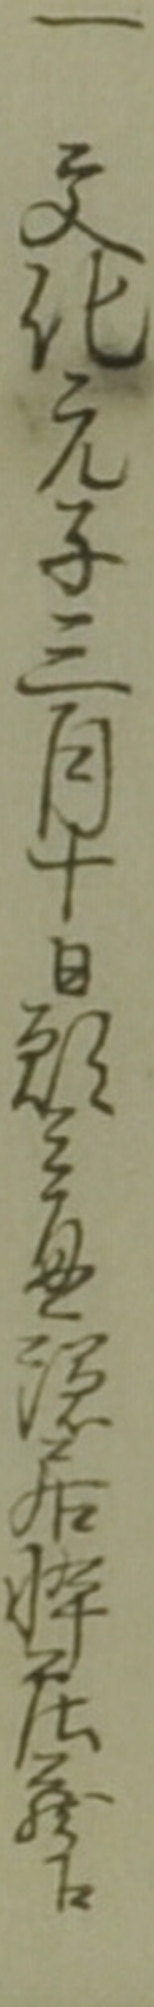一文化元子三月十日願之通隠居倅庄蔵江
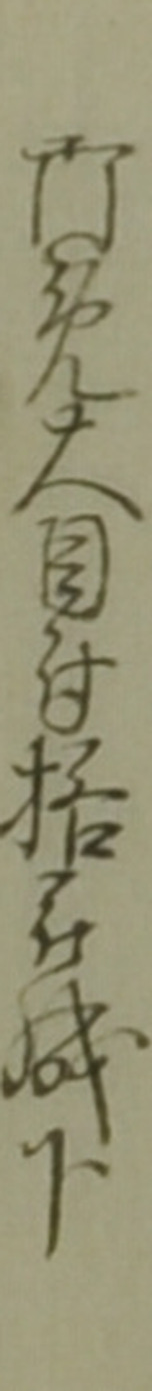御免大目付格被成下
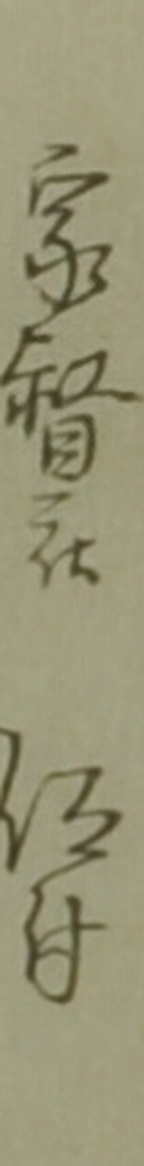家督被仰付
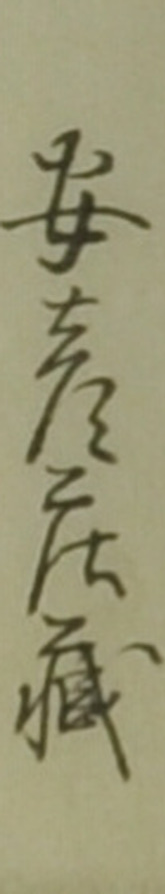安彦庄蔵

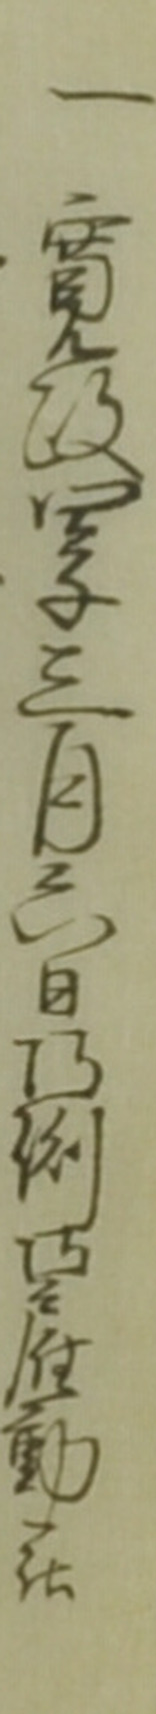一寛政四子三月六日御側御雇勤被
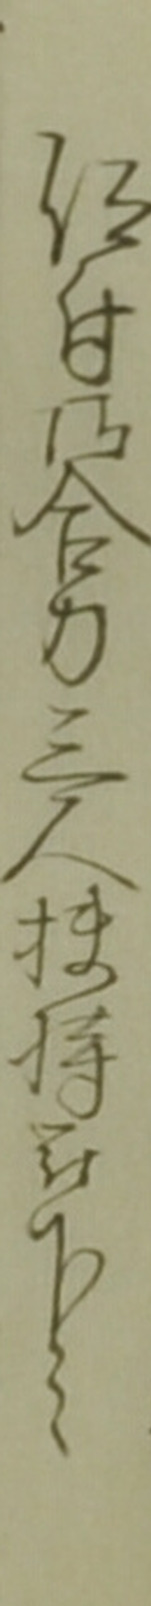仰付御合力三人扶持被下候
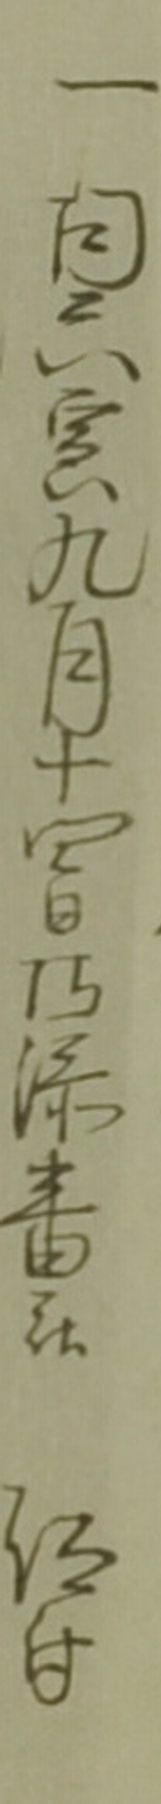一同六寅九月十四日御添番被仰付
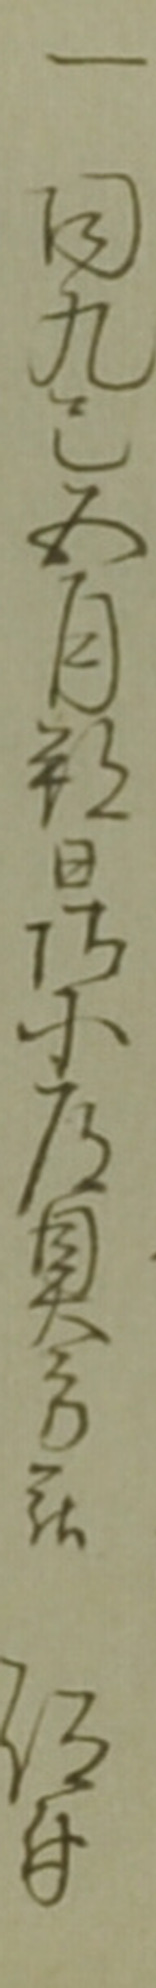一同九己五月朔日御小道具方被仰付
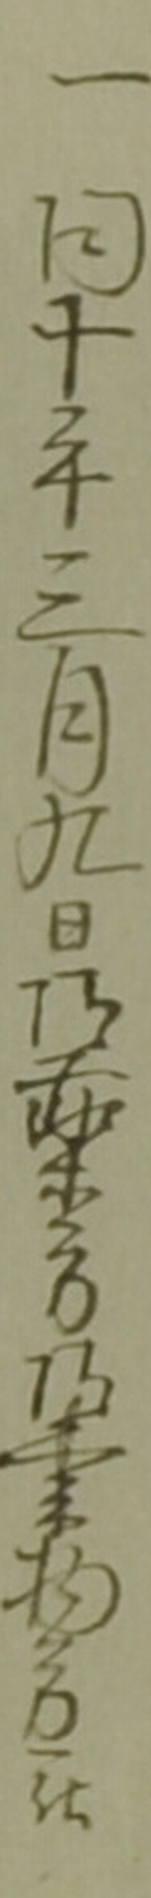一同十午三月九日御薬方御書物方被
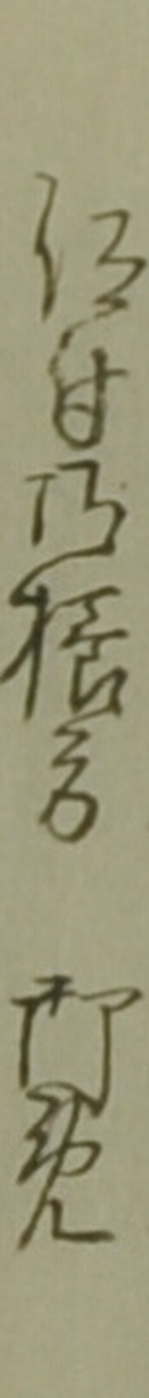仰付御櫛方御免
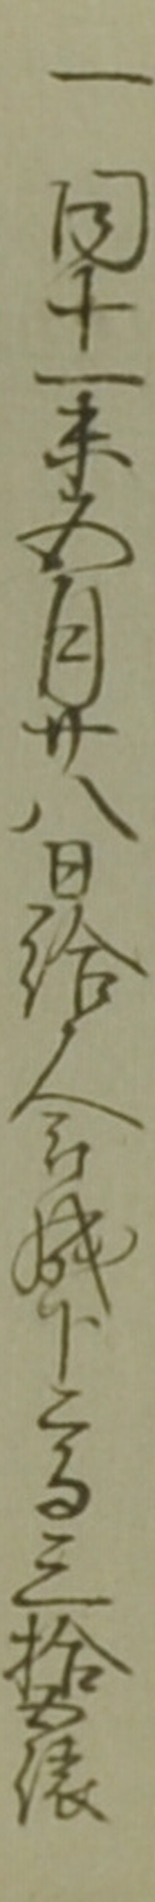一同十一未五月廿八日給人被成下高三拾五俵
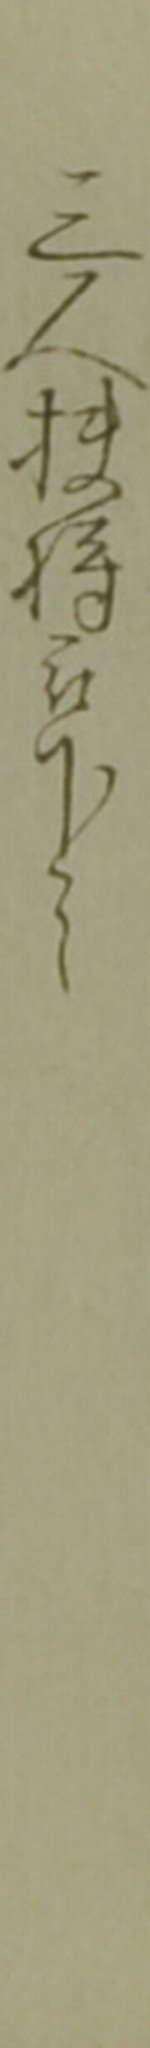三人扶持被下候
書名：給人諸士勤仕録（三）
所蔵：伊那市立高遠町図書館・合同会社AMANE
